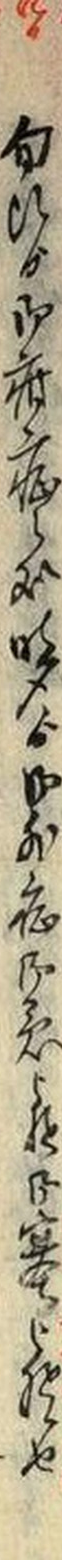旬頃ゟ御疳症之処昨夕ゟ御外症御急被遊御塞被遊候由
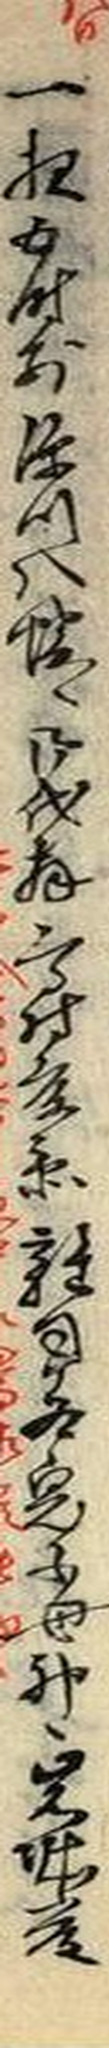一夜五時前深川八幡へ御代拝高村藤兵衛雑司ヶ谷鬼子母神へ岩城藤
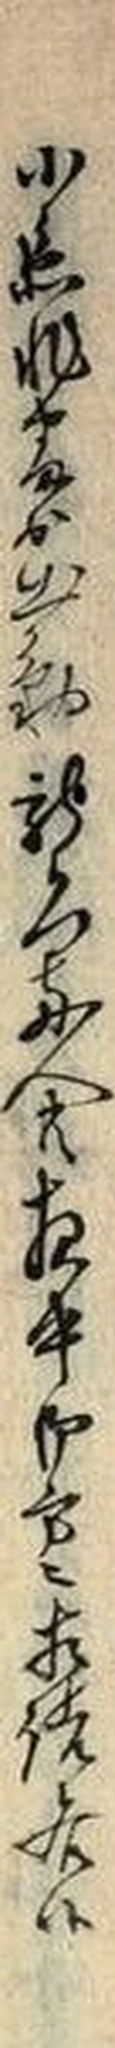小兵衛非番ゟ出勤新右衛門両人共夜中御方ニ相詰居候
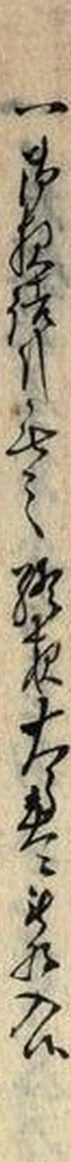一御夜詰引無之終夜大奥ニ被為入候
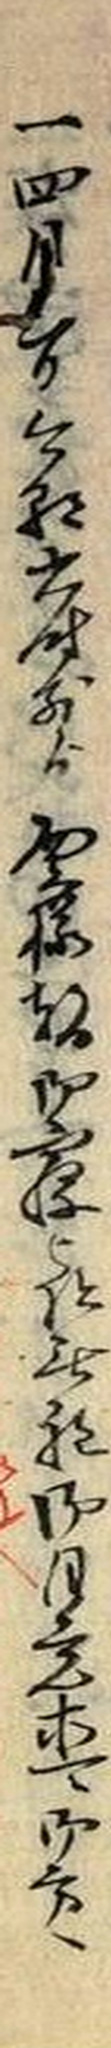一四月三日今朝六時前ゟ殿様暫御寝被遊無程御目覚直々御方へ

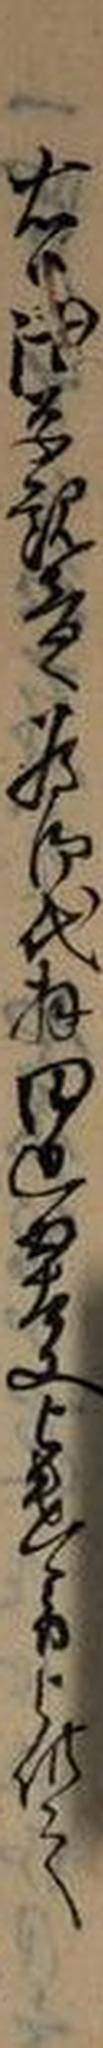右ハ浅草観音へ為御代拝田辺五太夫被遣候ニ付被供之
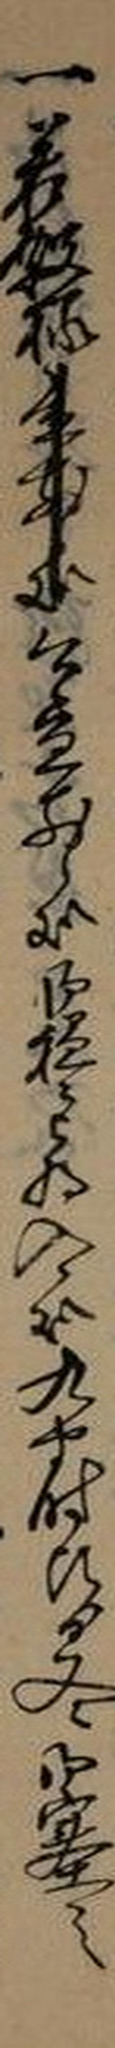一若殿様今昼前之処御穏ニ被為入候処九半時頃ゟ又々御塞之
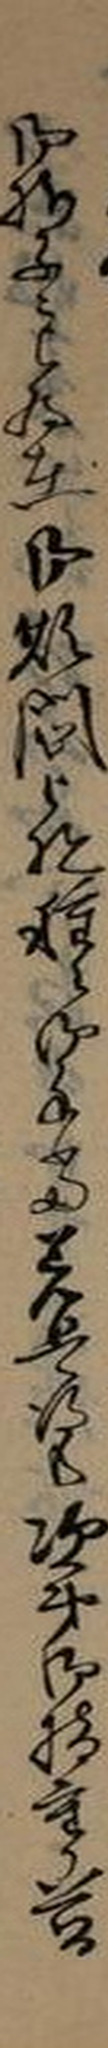御様子ニ被為在御煩悶被遊種々御手当差上候得共次第御指重り暮
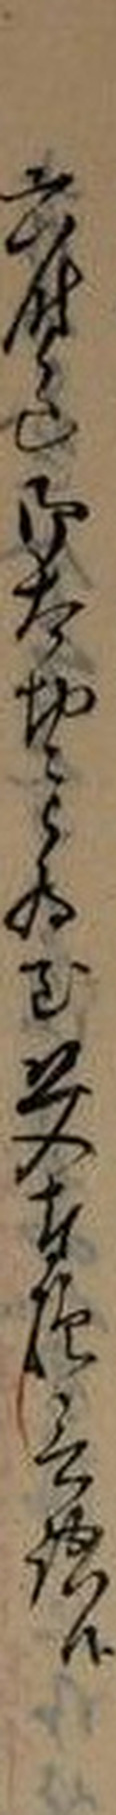六時過御大切ニ被為至恐入奉絶言語候
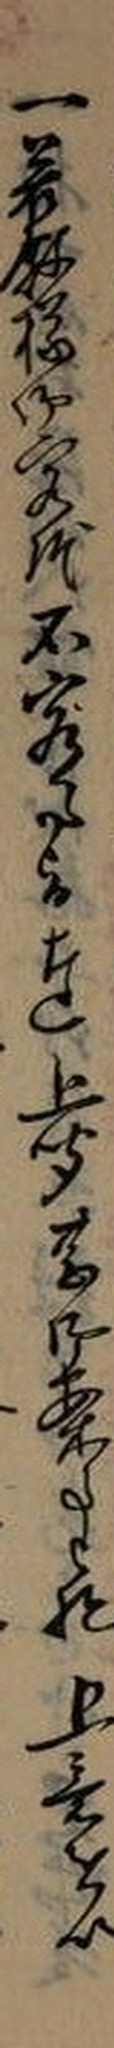一若殿様御容体不容易旨達上聞甚御案事被遊上意を以
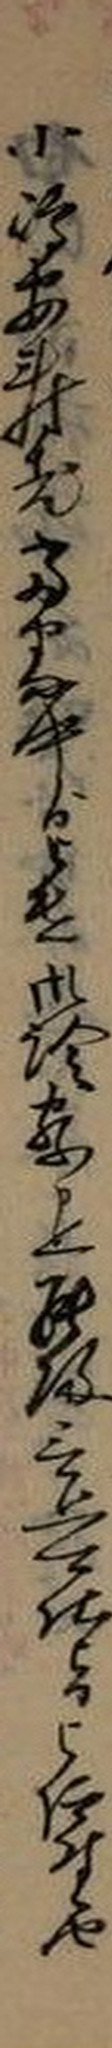小嶋安寿老当番中ゟ被遣御診察申上罷帰言上可仕旨被仰付候由
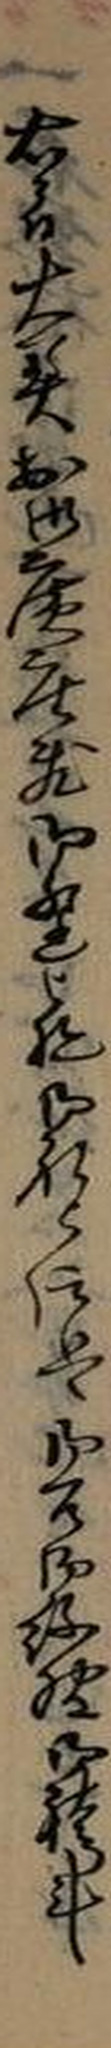右ニ付大奥於御広座敷御逢被遊御礼被仰上候御召御紋服御袴斗
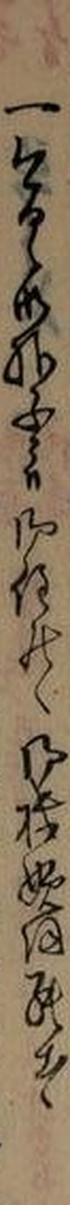一今日御様子ニ付御住居御機嫌伺罷出候
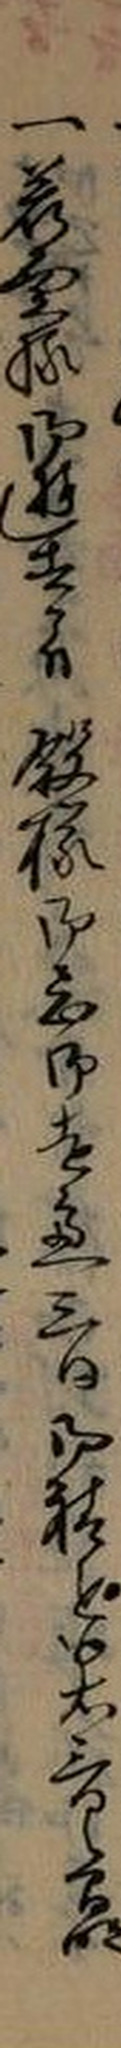一若殿様御逝去二付殿様御忌御遠慮三日御精進も右三日之間明
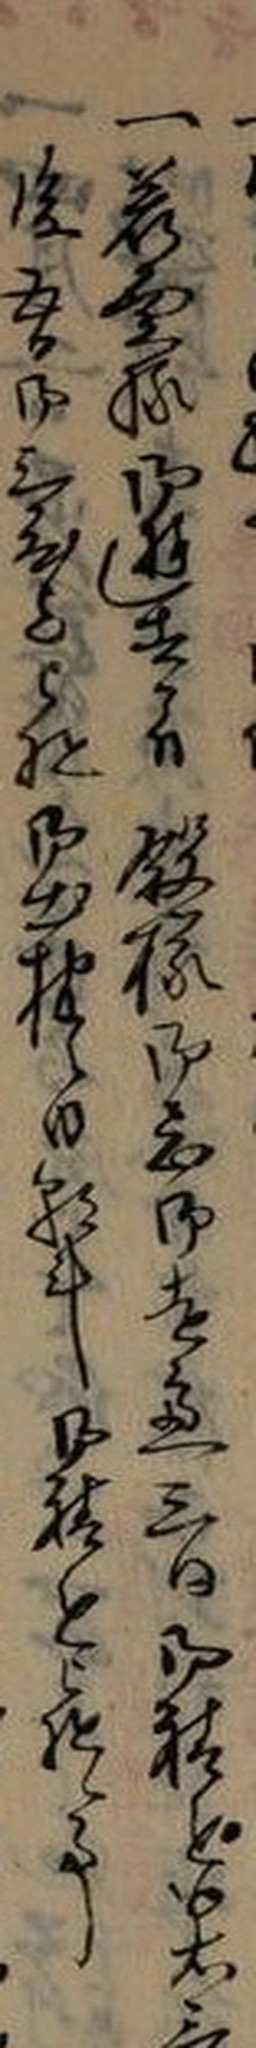後五日御三度迄被遊御出棺之日朝斗御精進被遊候事
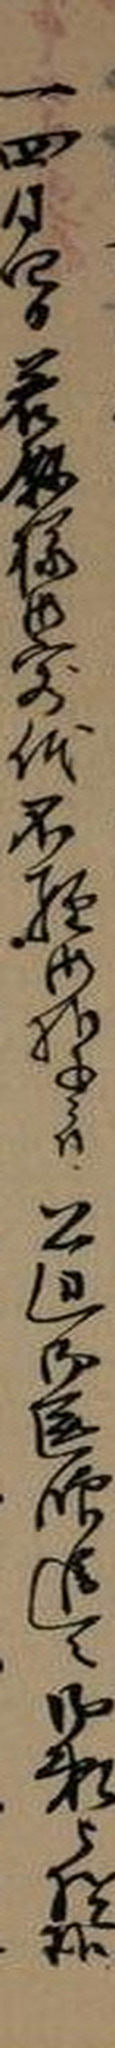一四月四日若殿様御容体不軽御様子ニ付公辺御医師追々御頼被遊候様
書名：少傅日録抄（斉承付側向頭取日記、在府）
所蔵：福井県文書館 Fukui Prefectural Archives
